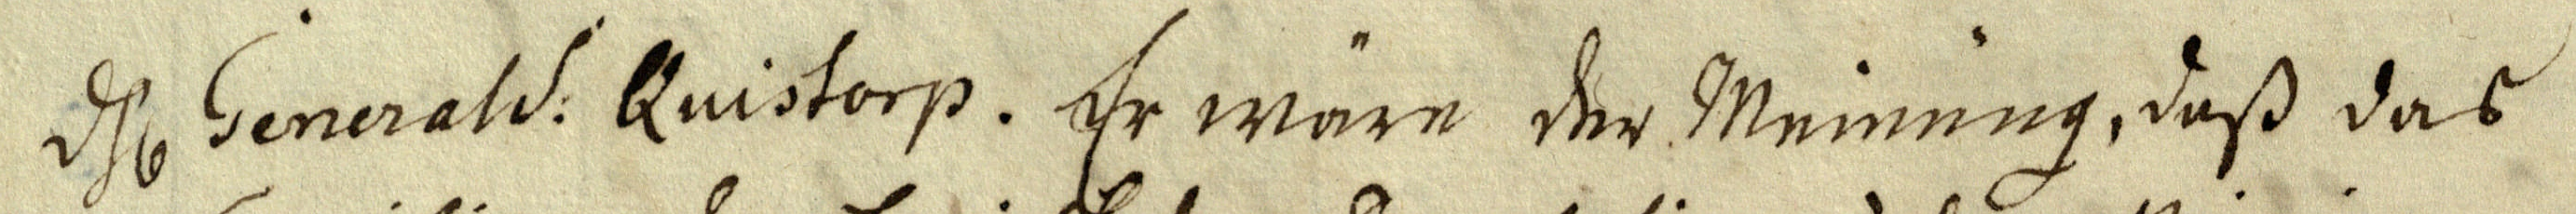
dh Generals: Quistorp. Er wäre der Meinung, daß das
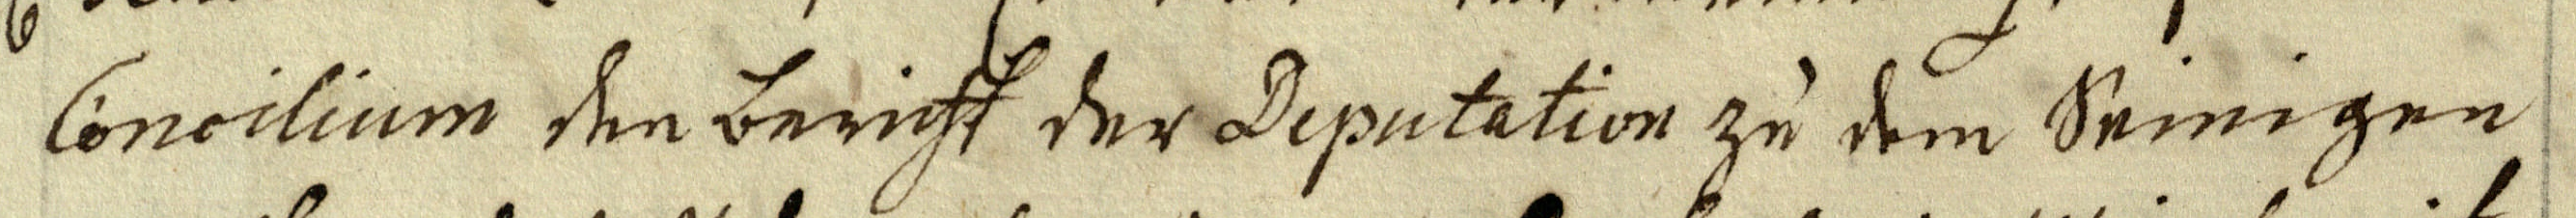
Concilium den Bericht der Deputation zu dem Seinigen
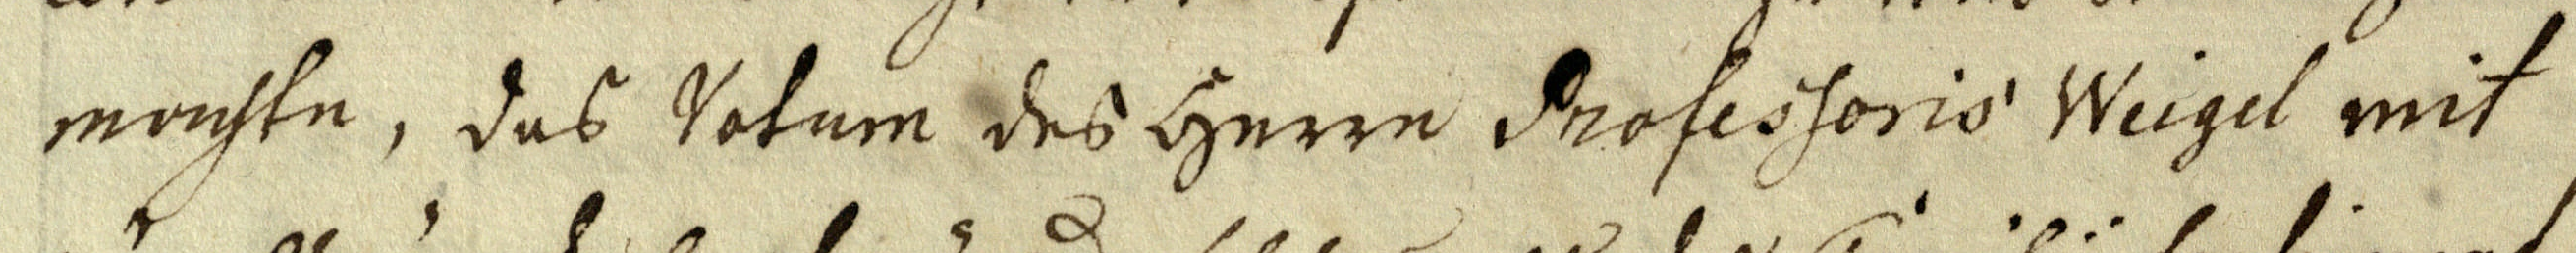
machte, das Votum des Herrn Professoris Weigel mit
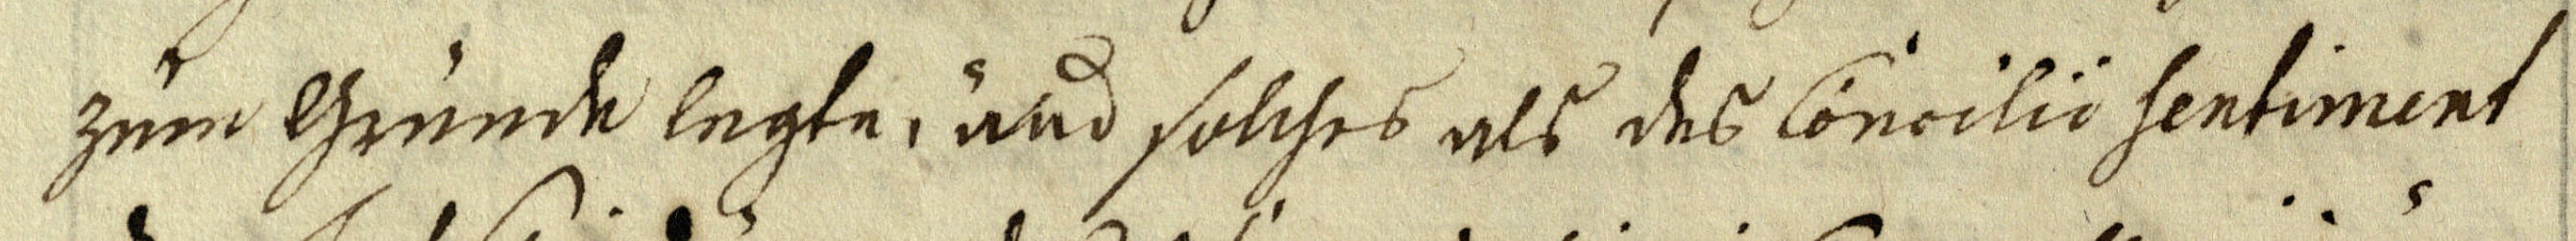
zum Grunde legte, und solches als des Concilii sentiment
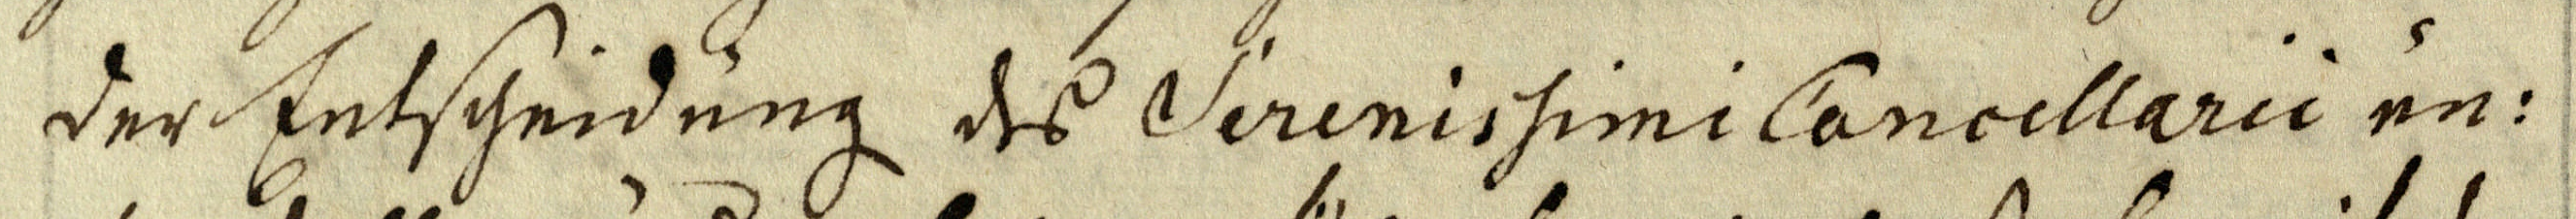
der Entscheidung des Serenissimi Cancellarii un¬
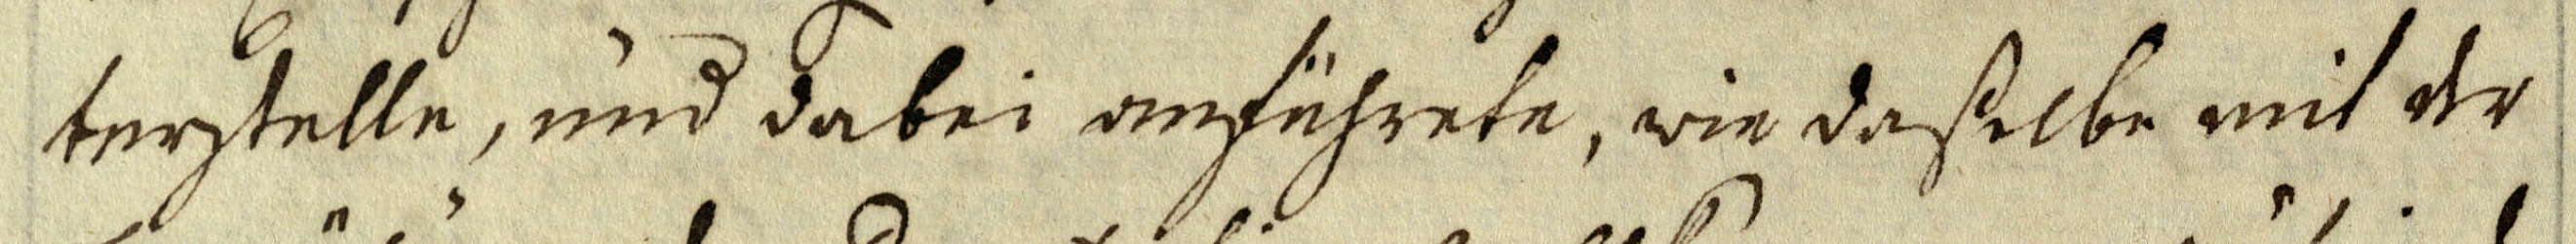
terstelle, und dabei anführete, wie daßelbe mit der
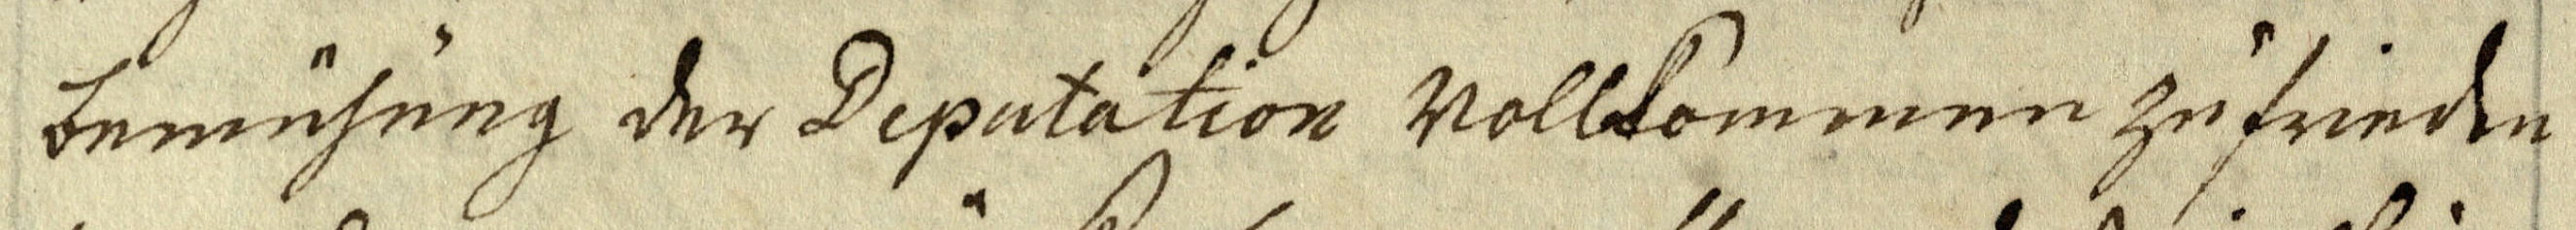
Bemühung der Deputation vollkommen zufrieden
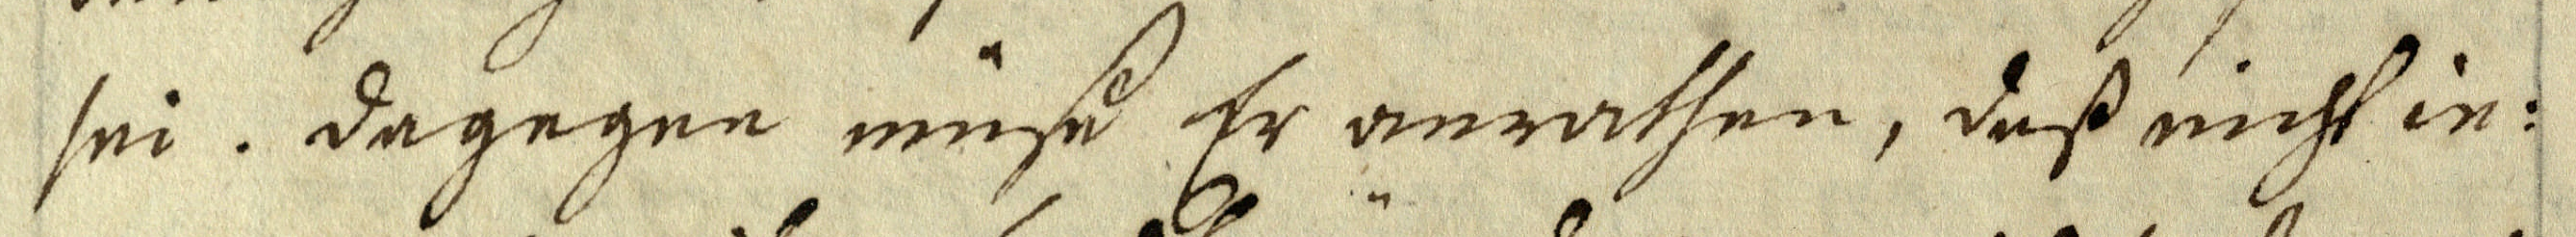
sei. Dagegen müße Er anrathen, daß nicht in¬
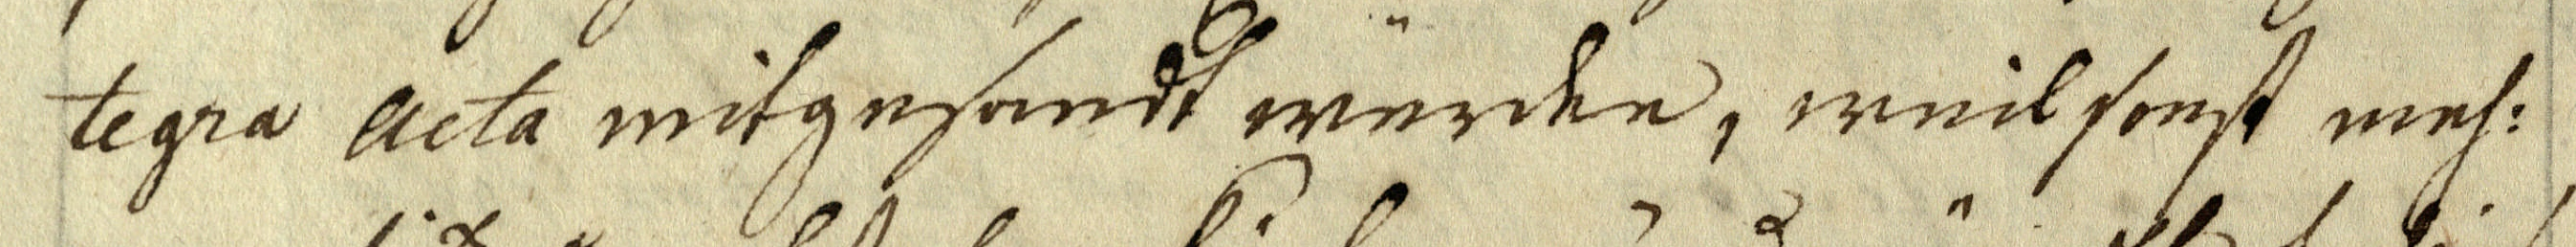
tegra Acta mitgesandt würden, weil sonst meh¬
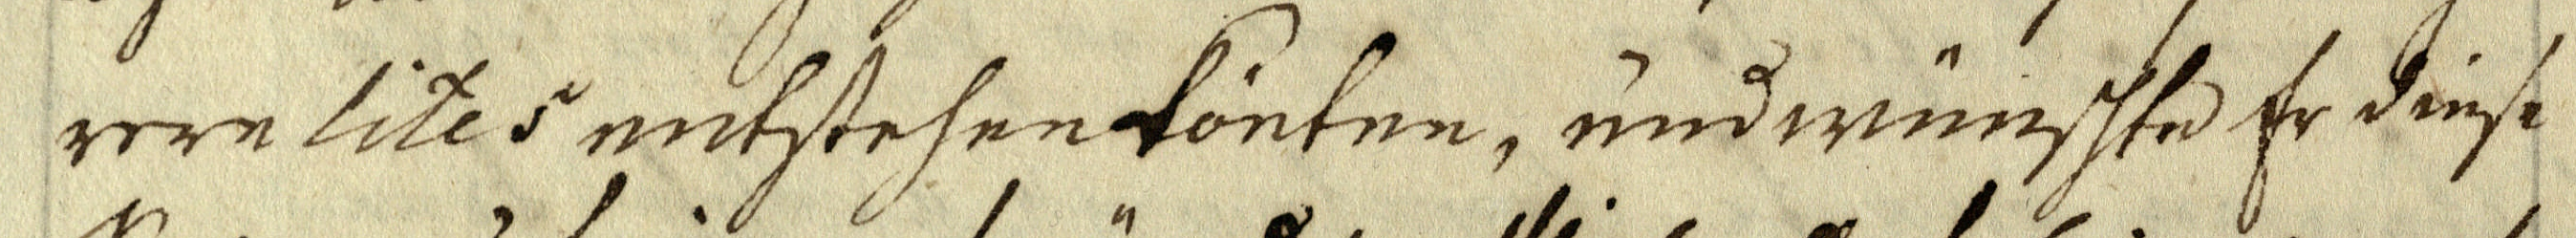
rer lites entstehen könten, und wünschte Er diese
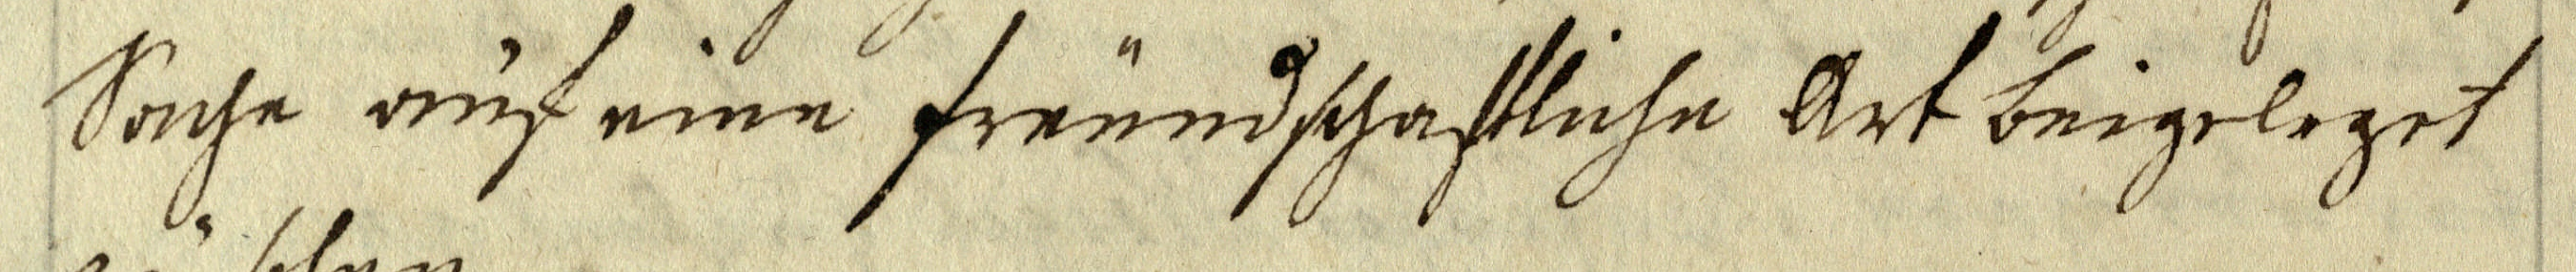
Sache auf eine freundschaftliche Art beigeleget
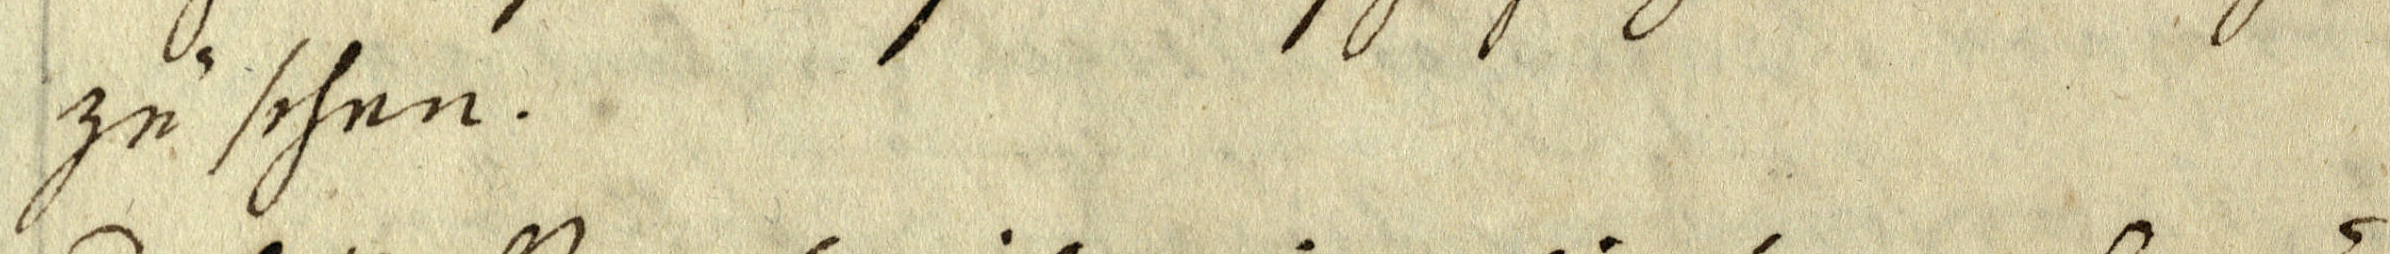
zu sehen.
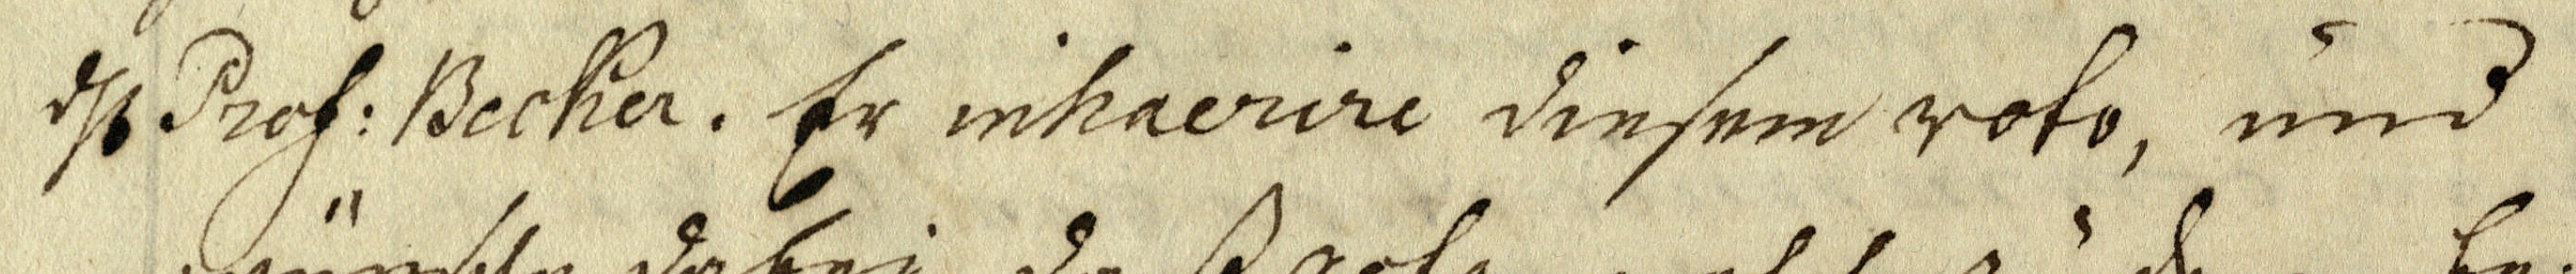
dh Prof: Becker. Er inhaerire diesem voto, und
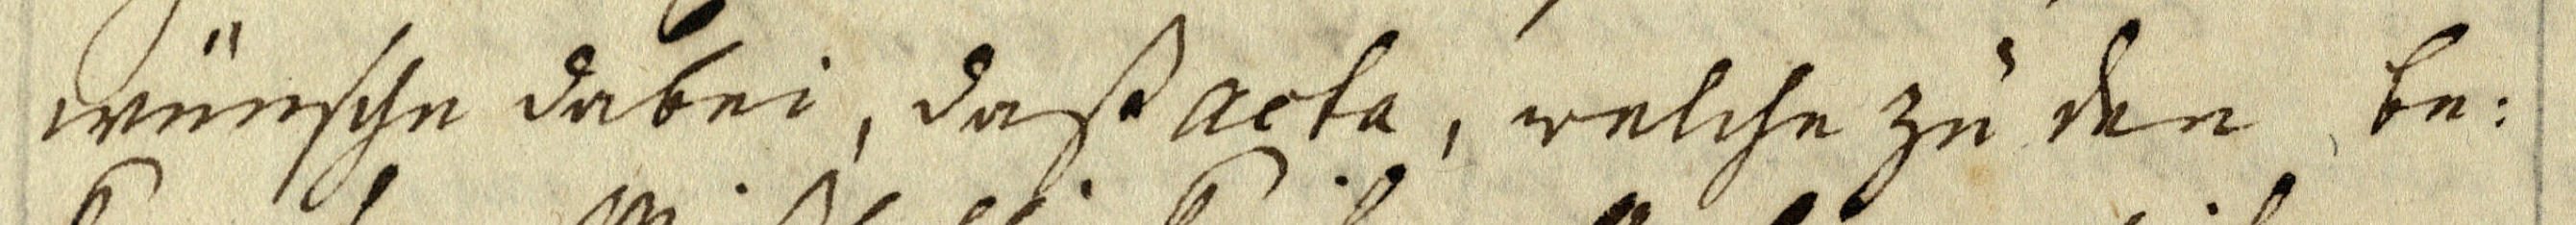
wünsche dabei, daß acta, welche zu den be¬
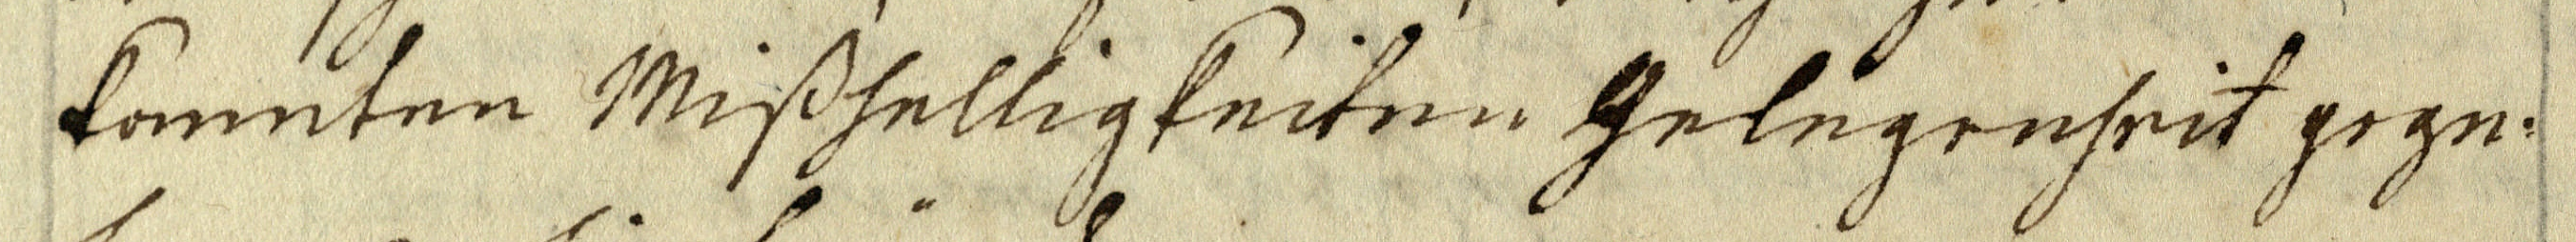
kannten Mißhelligkeiten Gelegenheit gege¬
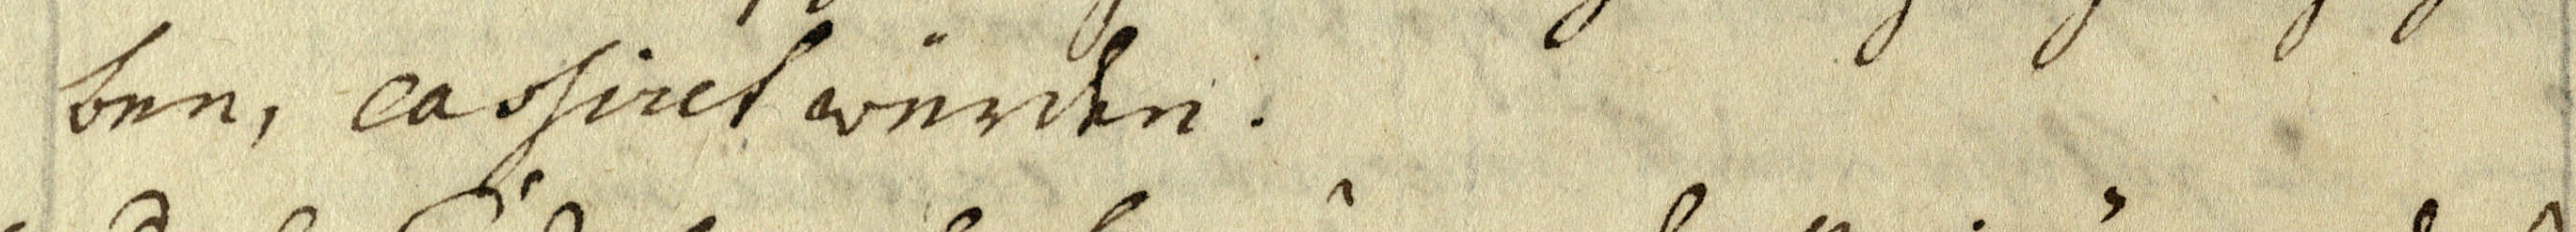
ben, cassiret würden.
